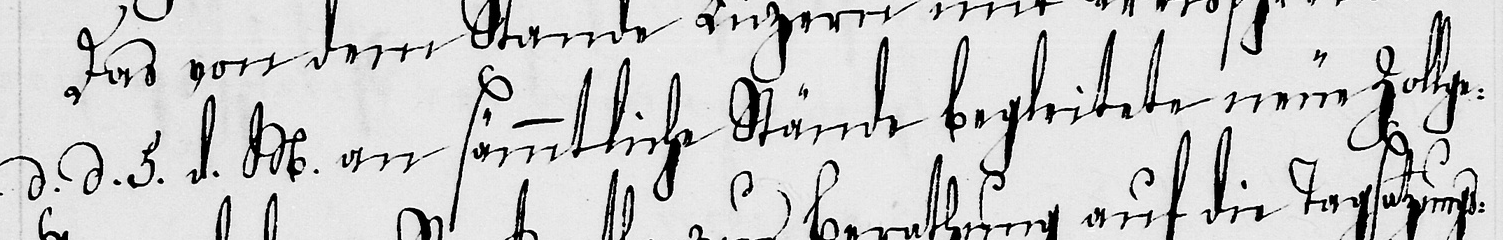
d. 5. d. M. an sämmtliche Stände begleitete neue Zol¬
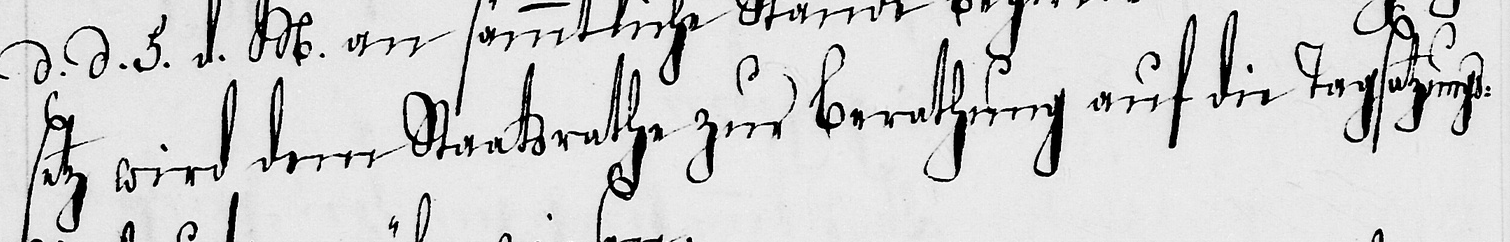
setz wird dem Staatsrathe zur Berathung auf die Tagsatz¬
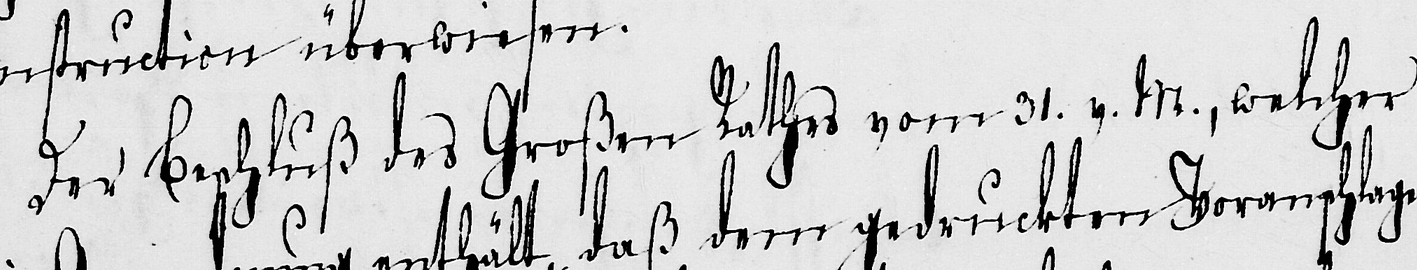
Der Beschluß des Großen Rathes vom 31 v. M., welcher
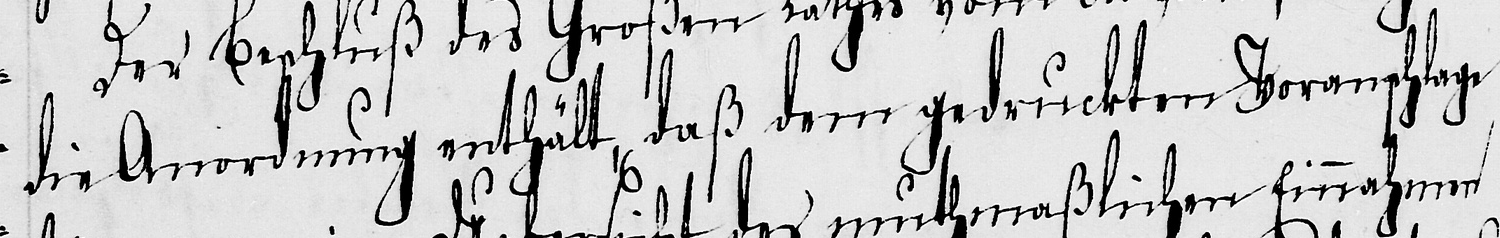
die Anordnung enthält, daß dem gedruckten Voranschlage
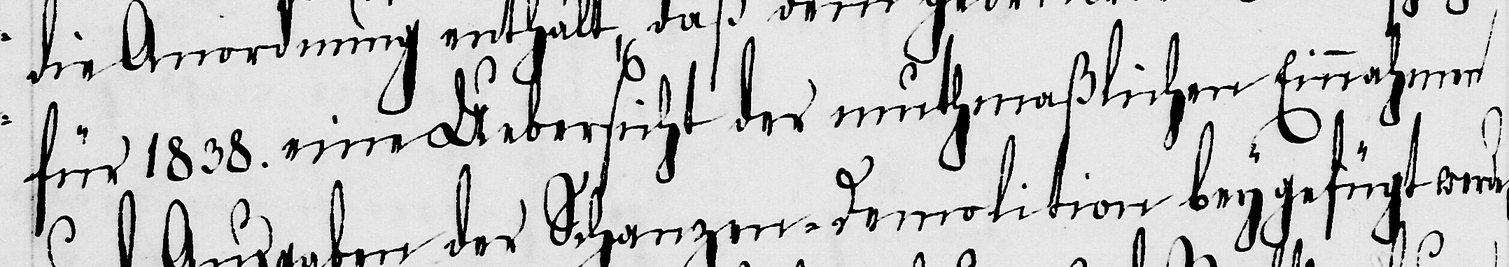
für 1838. eine Uebersicht der muthmaßlichen Einnahmen
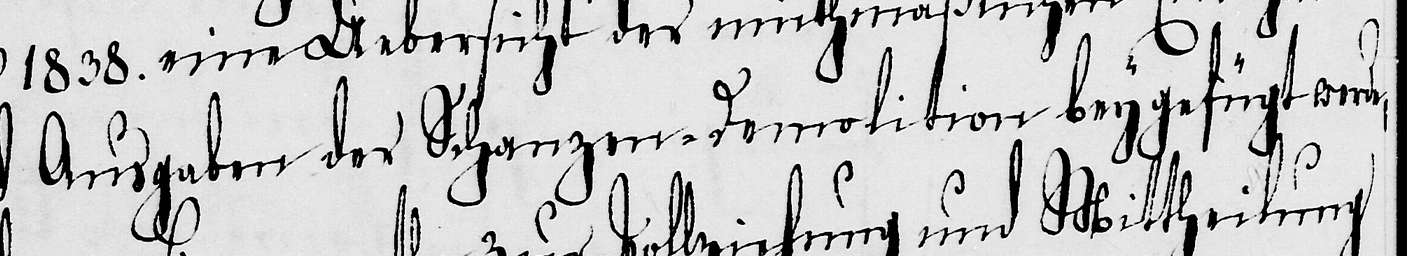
Ausgaben der Schnanzen-Demolition beygefügt we¬
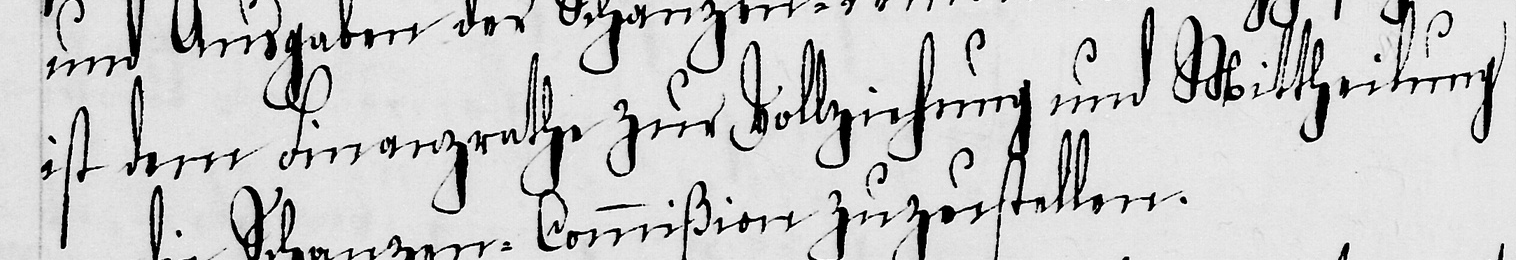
ist dem Finanzrathe zur Vollziehung und Mittheilung
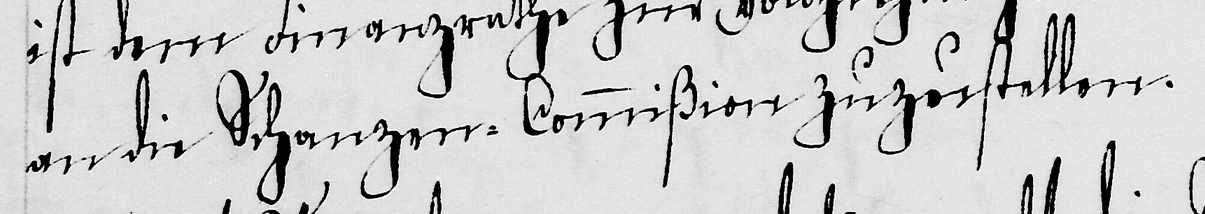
an die Schanzen-Commißion zuzustellen.
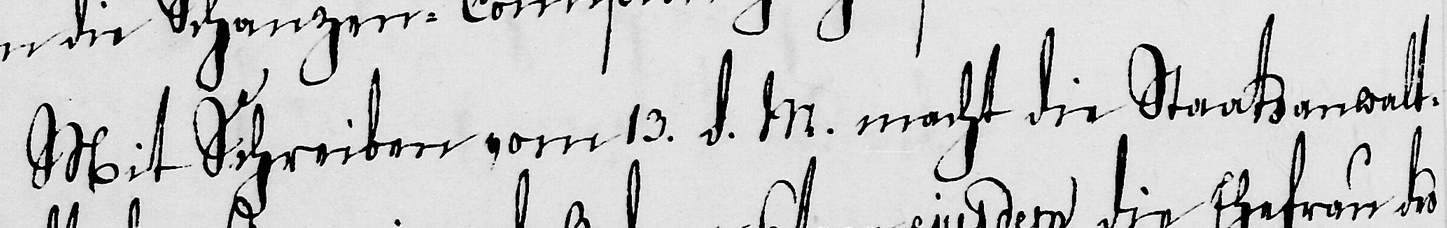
Mit Schreiben vom 13. d. M. macht die Staatsanwalt¬
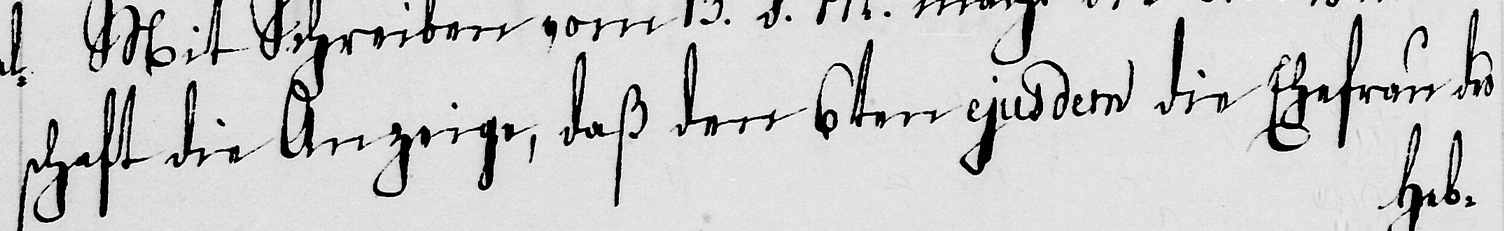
schaft die Anzeige, daß den 6ten ejusdem die Ehefrau d¬
